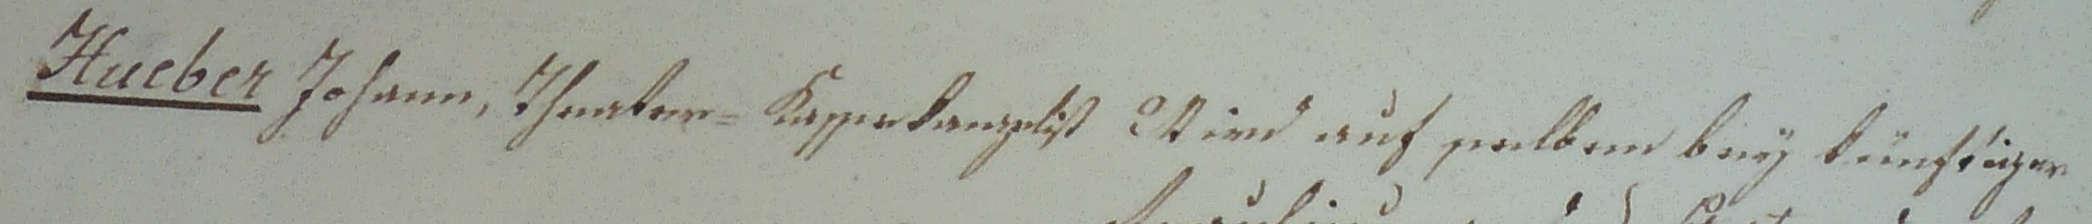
Hueber Johann, Theater=Kassekanzelist Wird auf selben bey künftiger
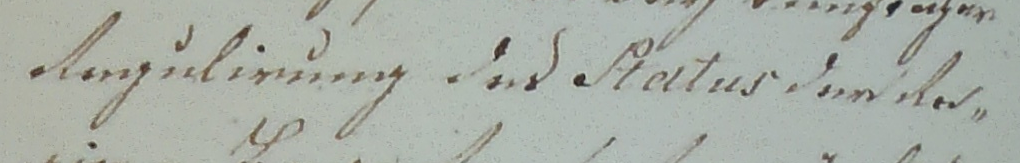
Regulirung des Status der Re¬
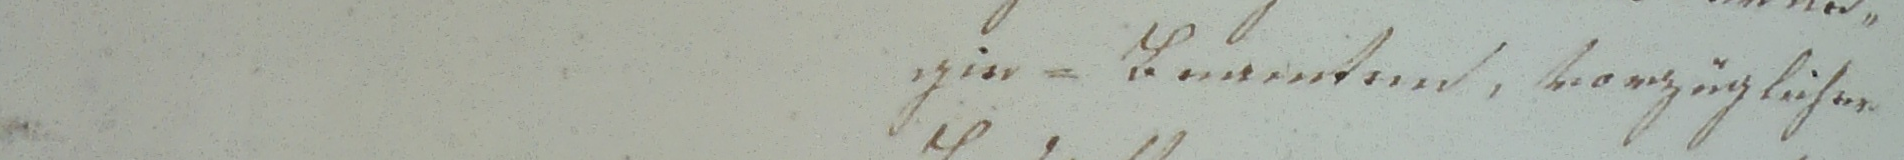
gie = Beamten, vorzüglicher
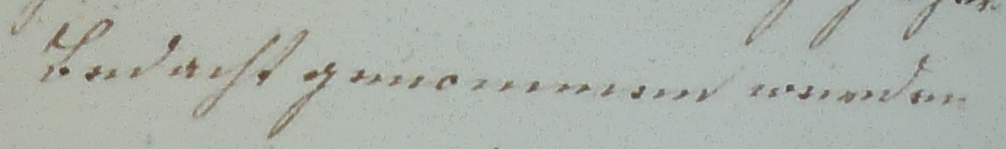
Bedacht genommen werden
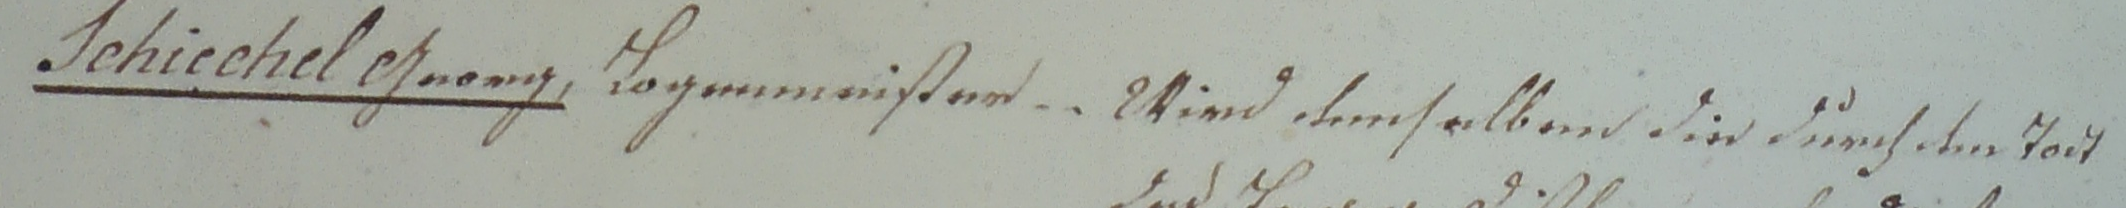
Schiechel Georg, Logenmeister .. Wird demselben die durch den Todt
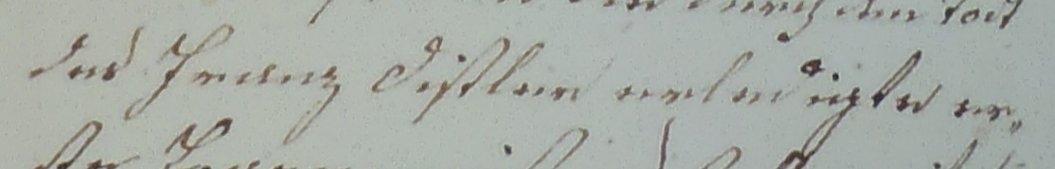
des Franz Distler erledigte er¬
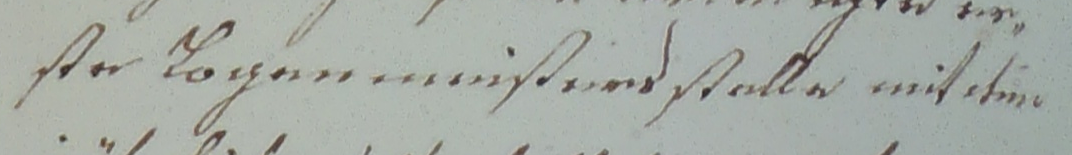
ste Logenmeistersstelle mit dem
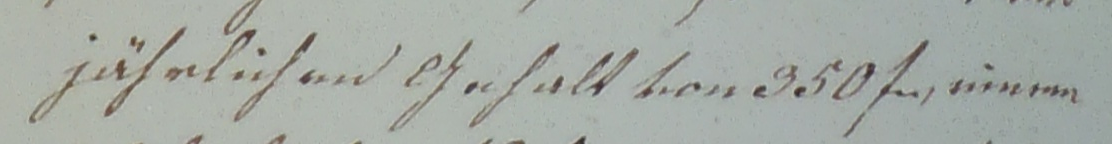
jährlichen Gehalt von 350 fn, einem
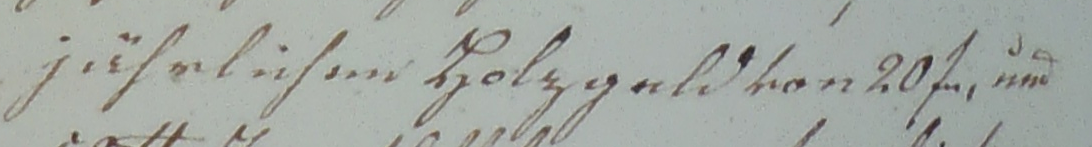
jährlichen Holzgeld von 20 fn, und
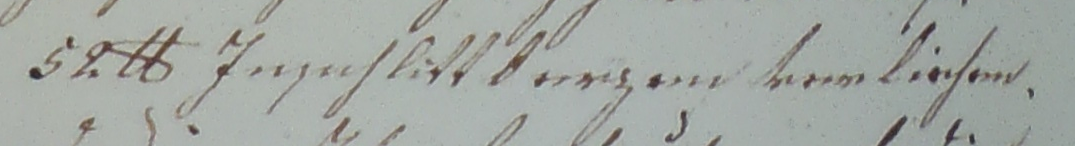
52 lb Jnschlittkerzen verliehen.
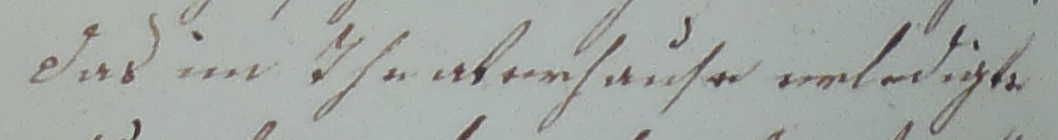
Das im Theaterhause erledigte
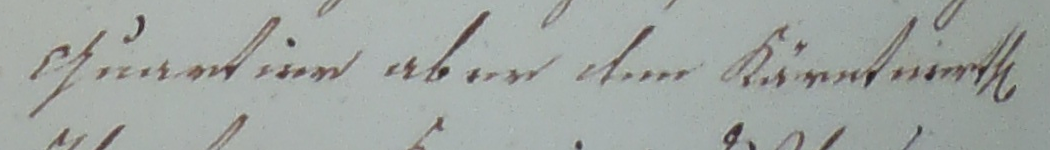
Quartier aber dem KärntnerthE
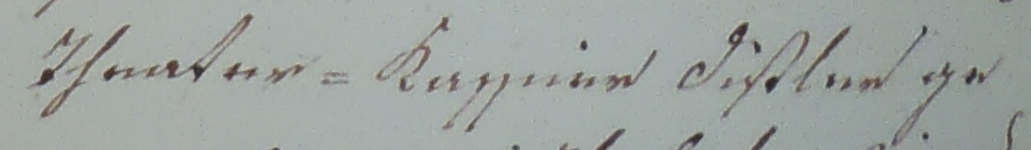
Theater=Kassier Distler ge¬
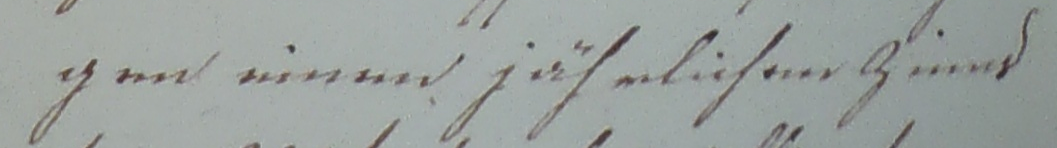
gen einen jährlichen Zins
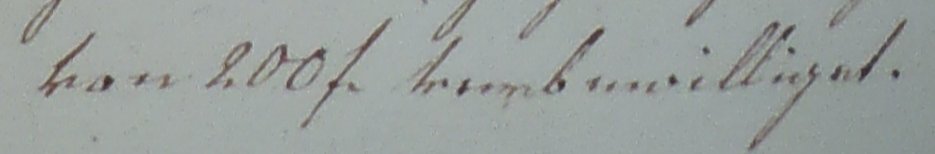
von 200 fn verbewilliget.
